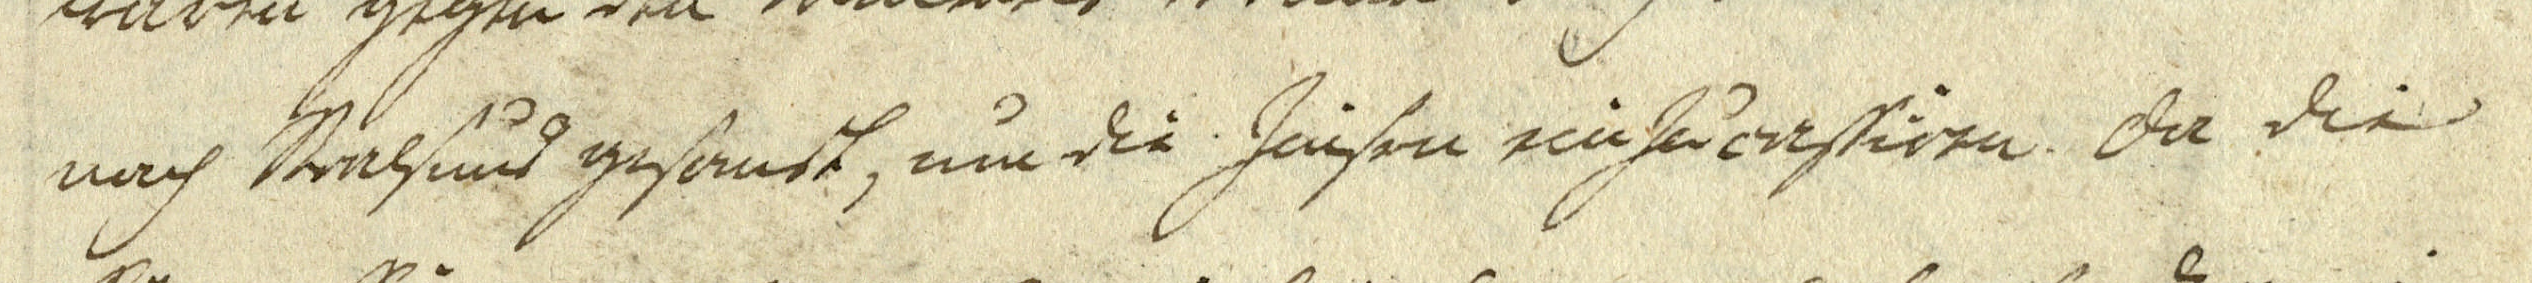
nach Stralsund gesandt, um die Zinsen einzucassiren. Da die
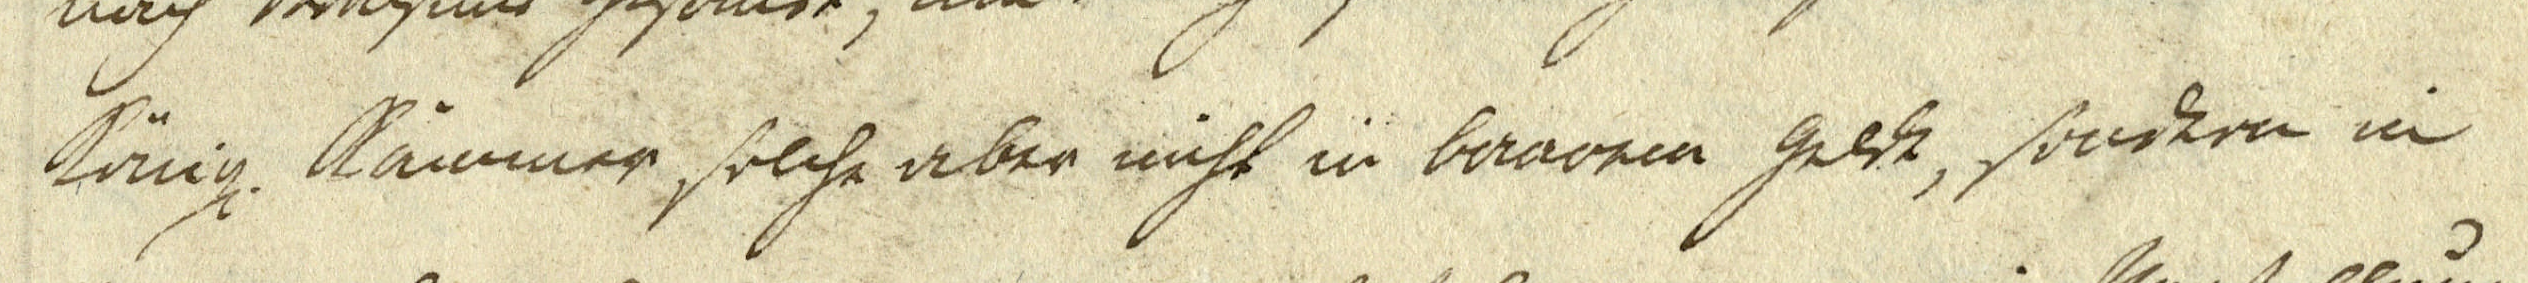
Königl. Kammer solche aber nicht in baarem Gelde, sondern in
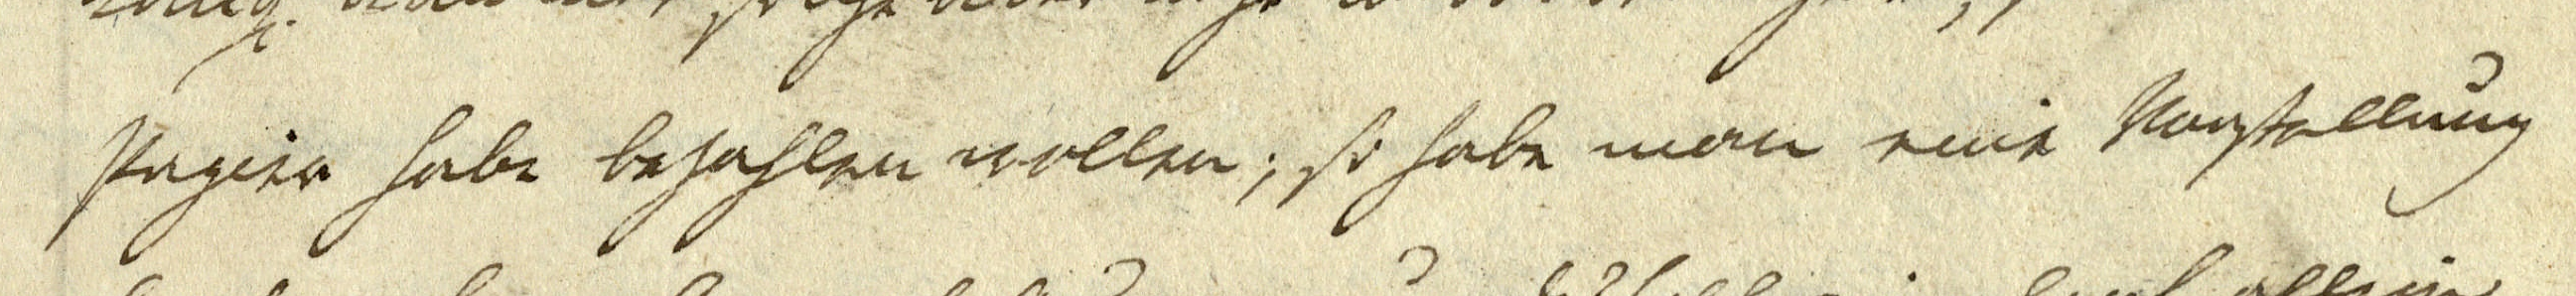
Papier habe bezahlen wollen; so habe man eine Vorstellung
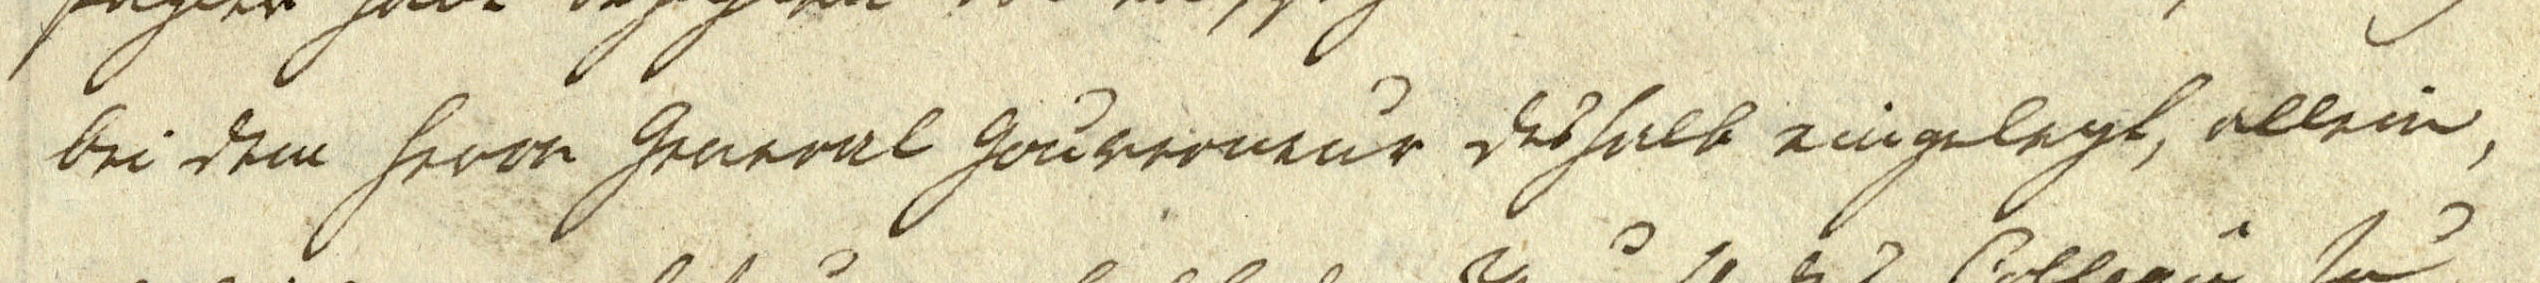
bei dem Herrn General Gouverneur deshalb eingelegt, allein,
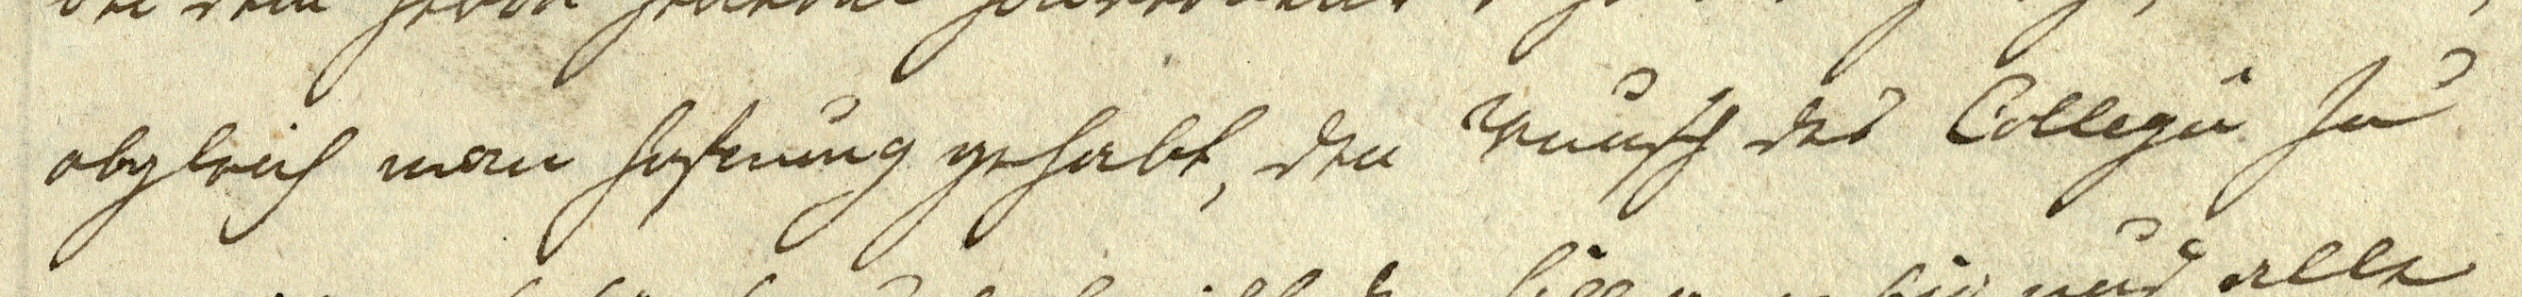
obgleich man Hofnung gehabt, den Wunsch des Collegii zu
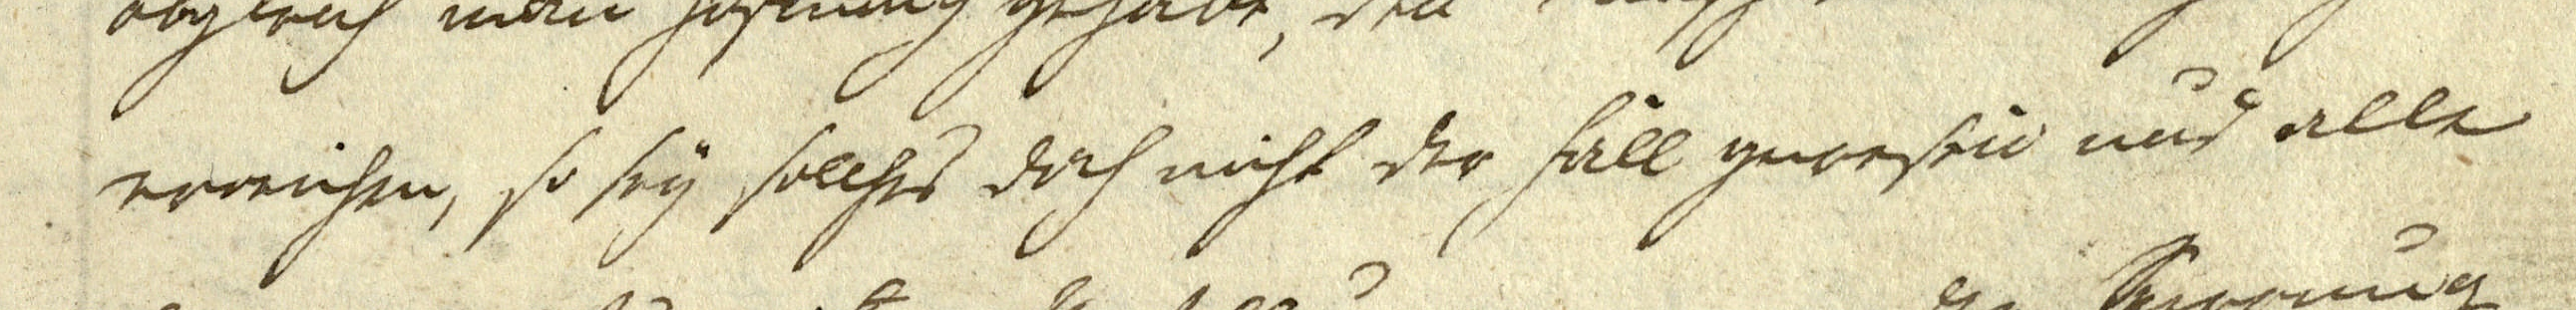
erreichen, so seÿ solches doch nicht der Fall gewesen und alle
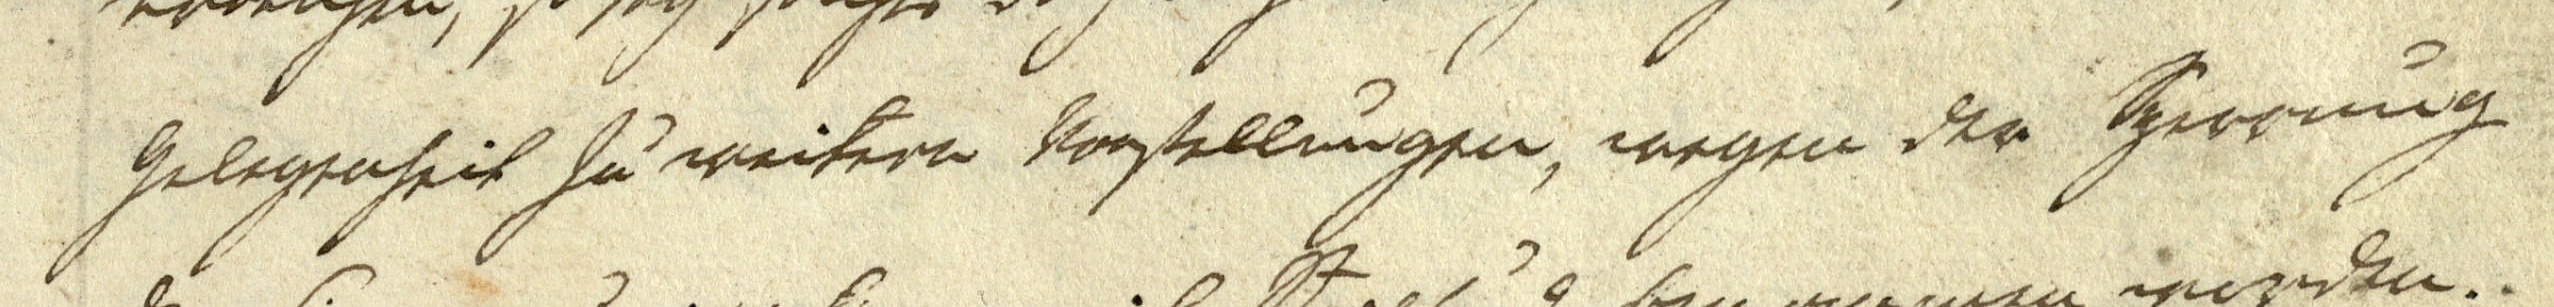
Gelegenheit zu weitern Vorstellungen, wegen der Sperrung
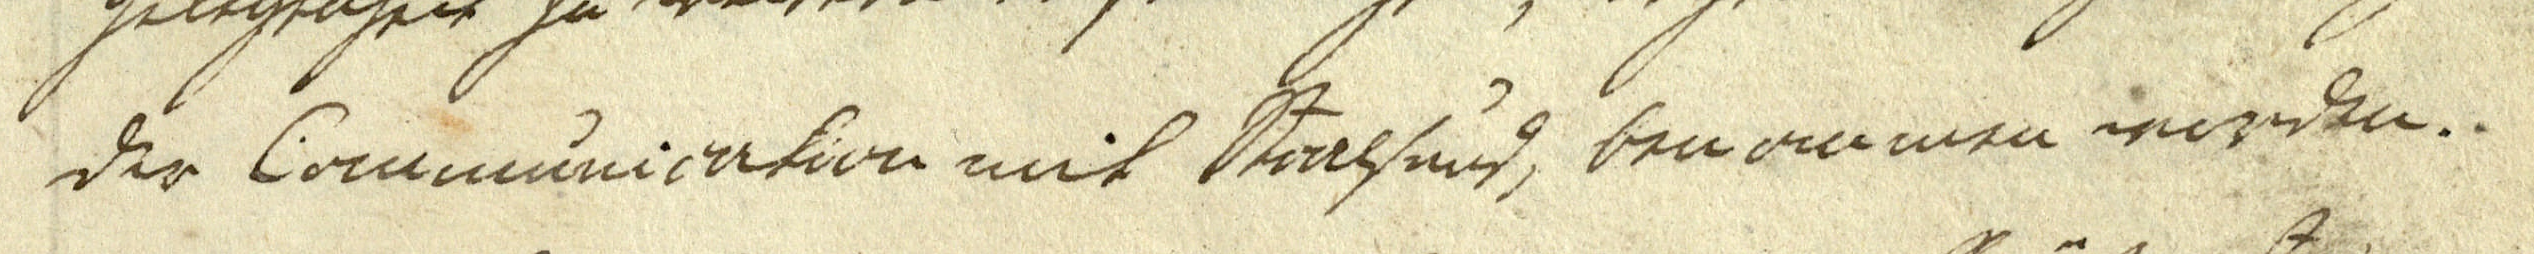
der Communication mit Stralsund, benommen worden.
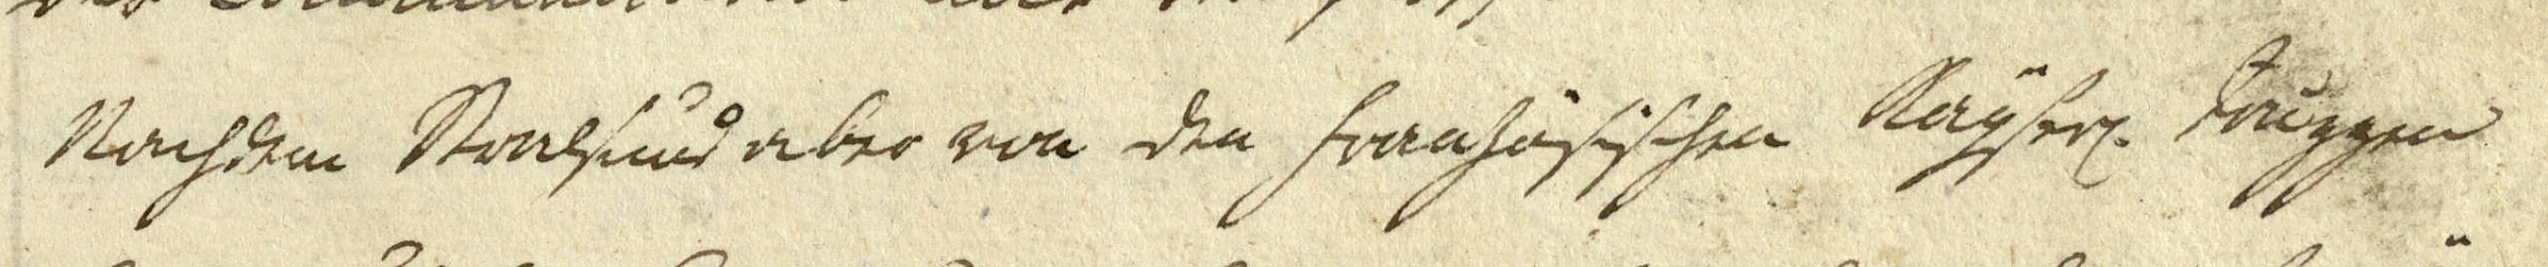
Nachdem Stralsund aber von den Französischen Kaÿserl. Truppen
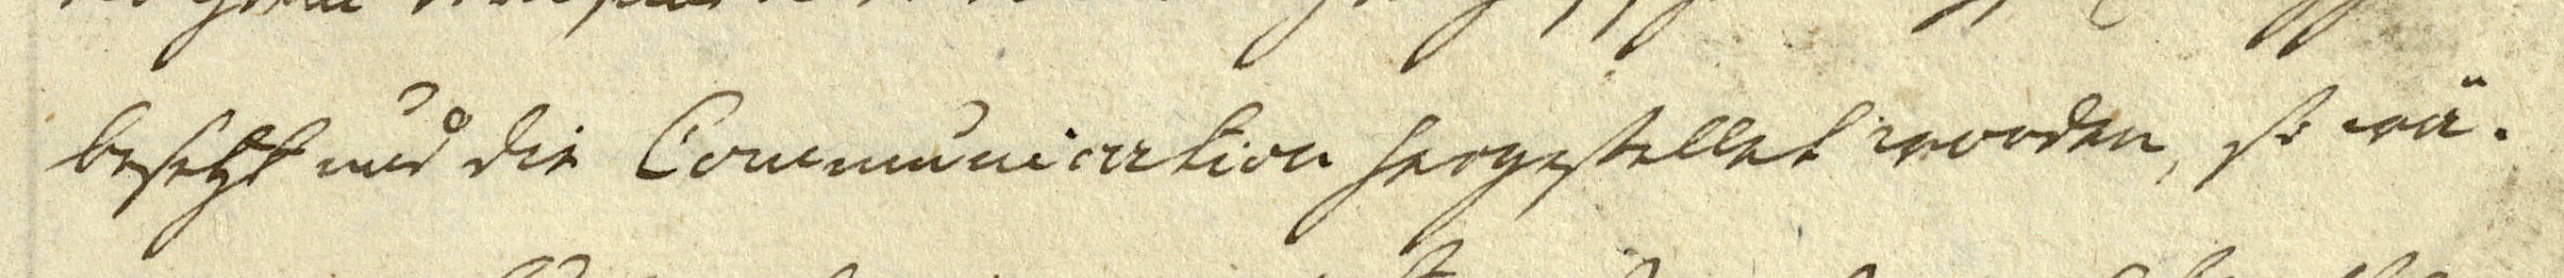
besetzt und die Commmmnication hergestellet worden, so wä¬
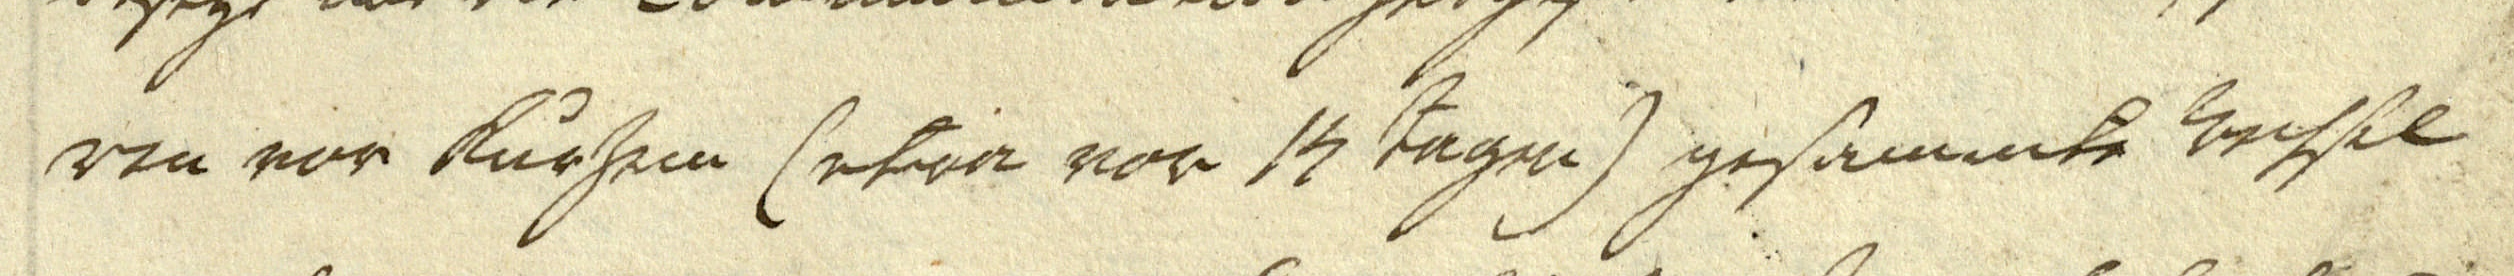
ren vor kurzem ( etwa vor 14 Tagen ) gesammte Wechsel
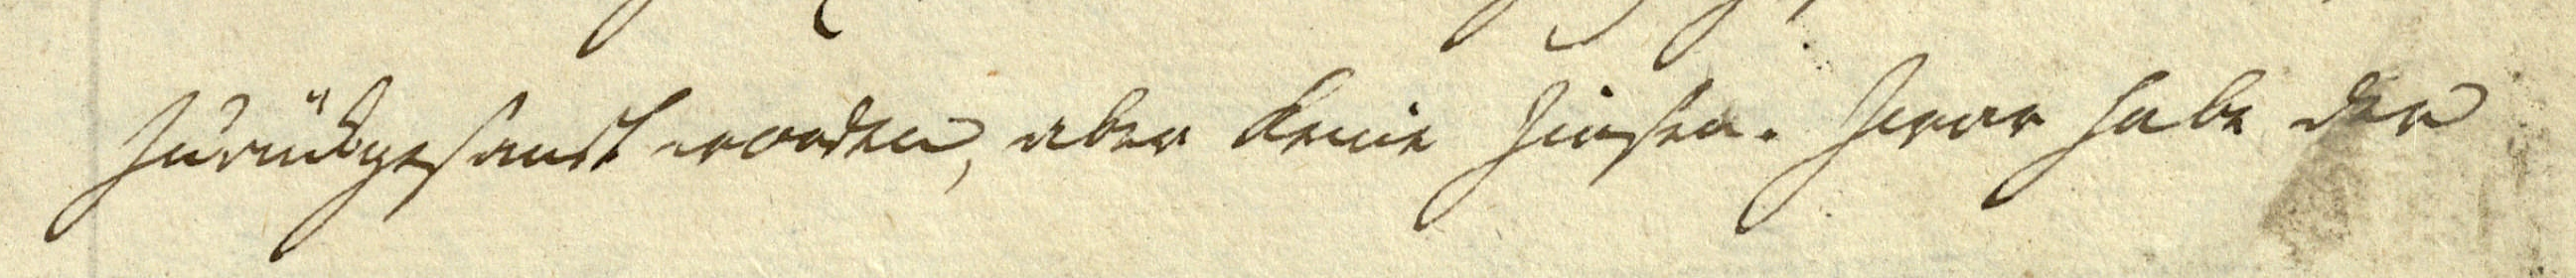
zurückgesandt worden, aber keine Zinsen. Zwar habe der
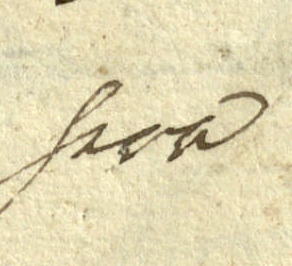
Herr
